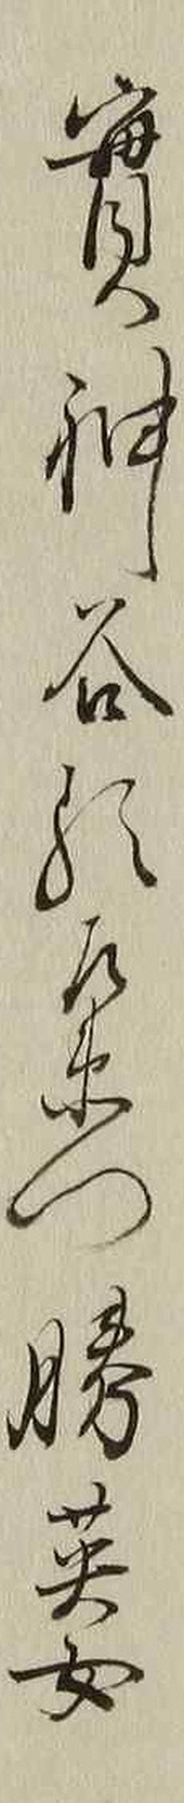実神谷類左衛門勝英女
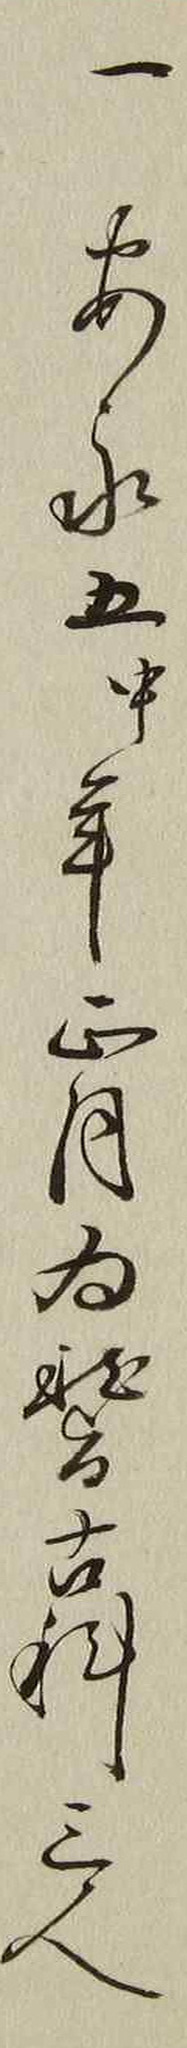一安永五申年正月為稽古料三人
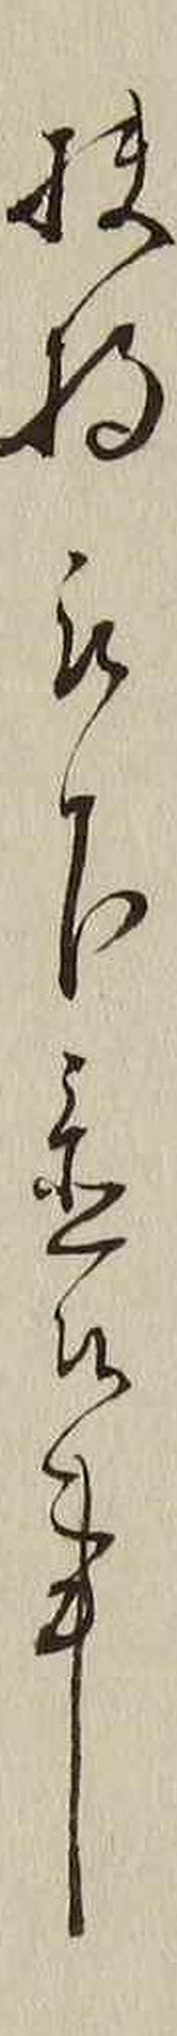扶持被下置候事
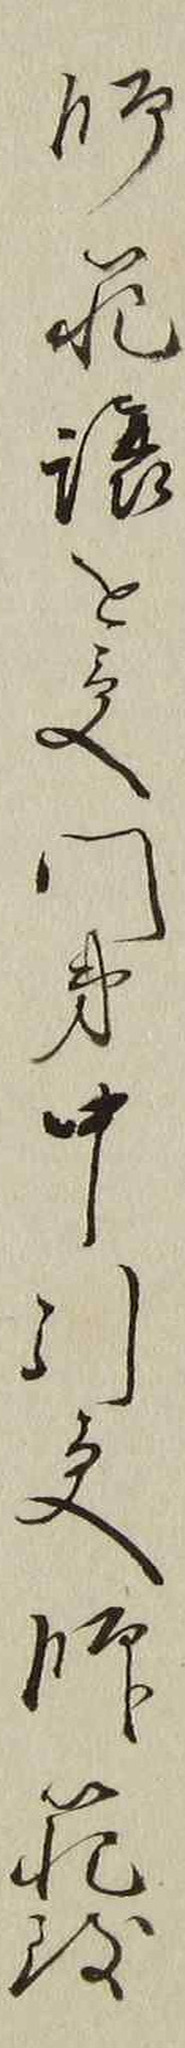師範譲を受門弟中引受師範致
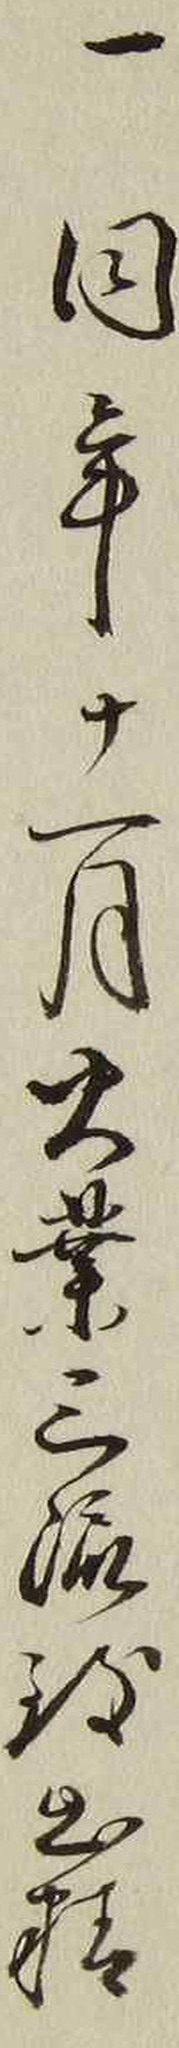一同年十一月火業三流致出精
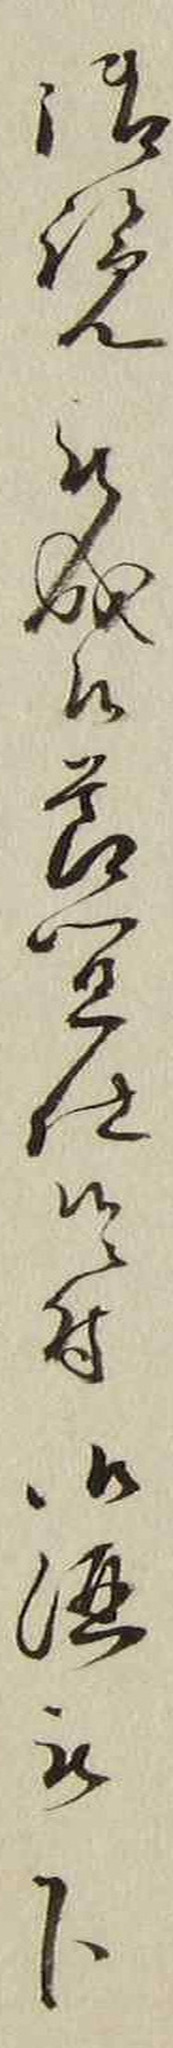御覧被成候節宜仕候付御酒被下
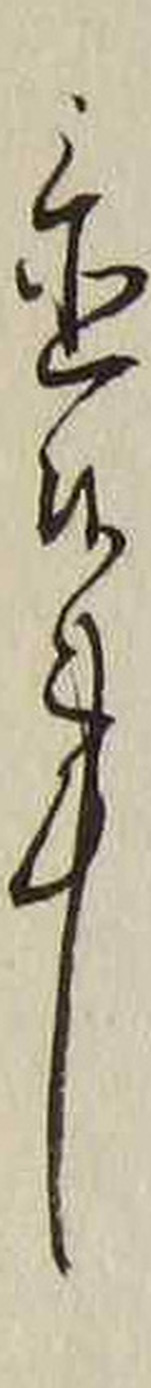置候事
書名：諸士系譜　巻之7　い之部7
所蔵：会津若松市立会津図書館
